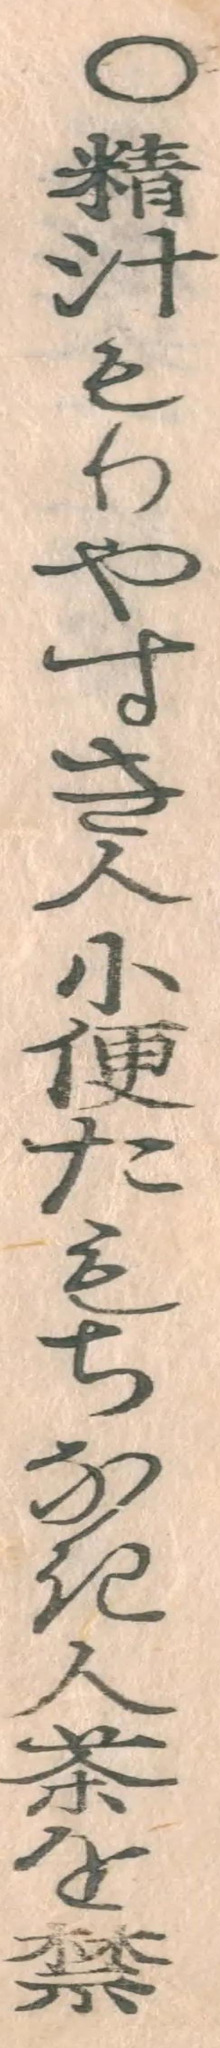〇精汁もりやすき人小便たもちなき人茶を禁
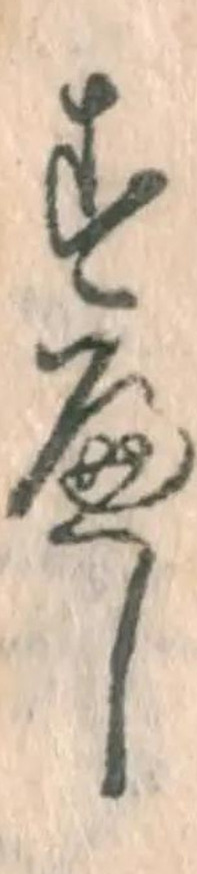すへし
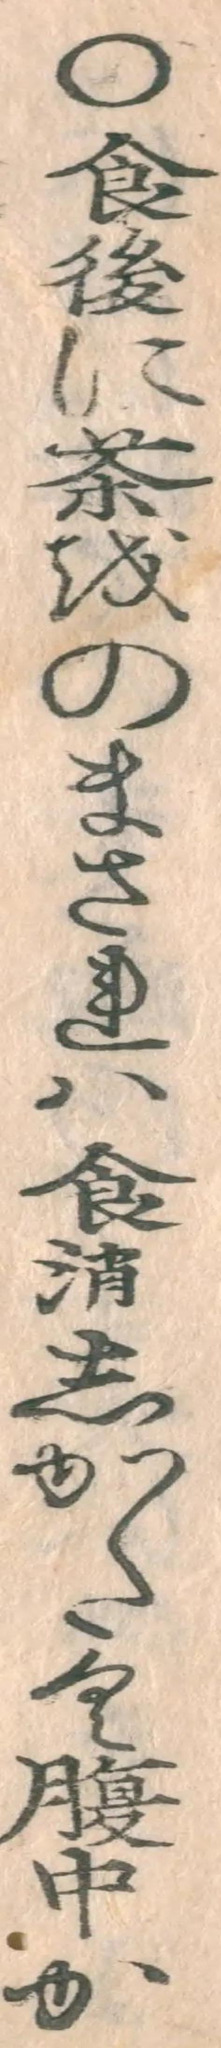〇食後に茶をのまされは食消しかたく腹中か
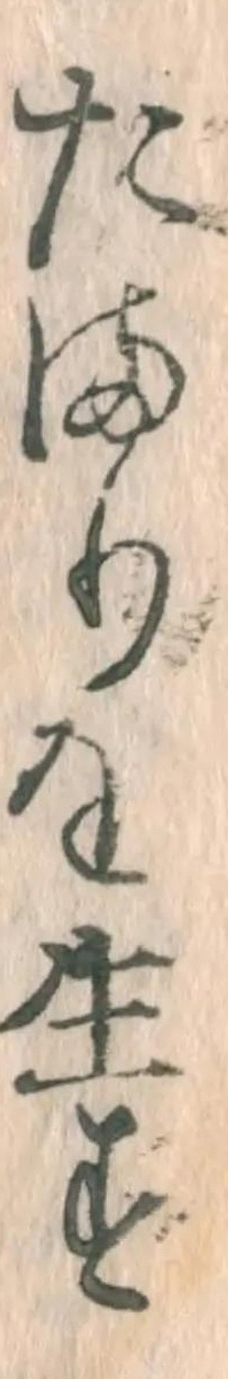たまりを生す

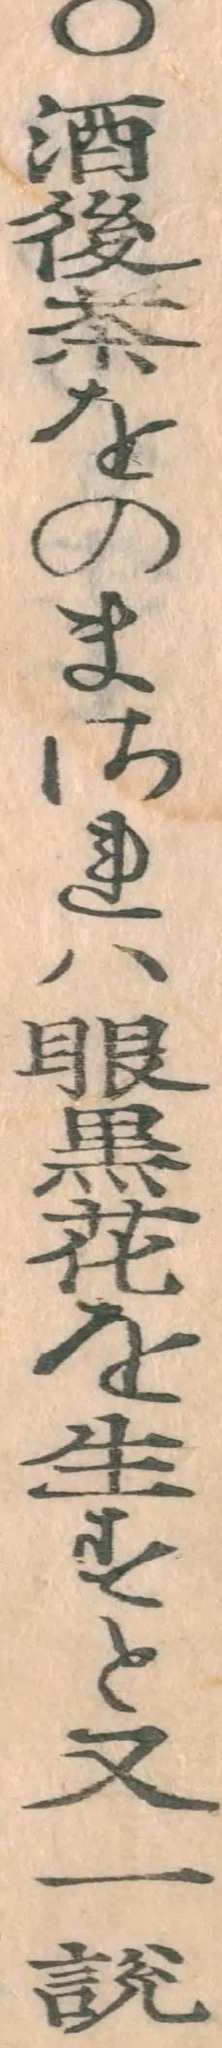〇酒後茶をのまされは眼黒花を生すと又一説
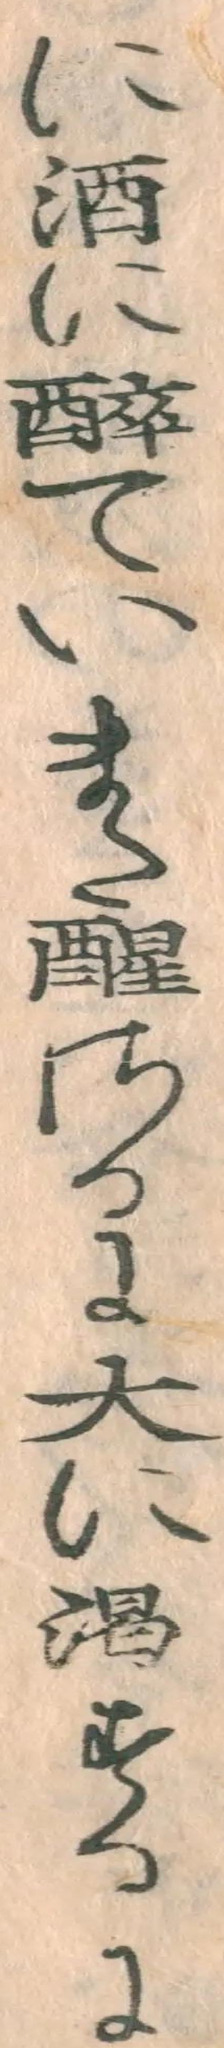に酒に酔ていまた醒さるに大に渇するに
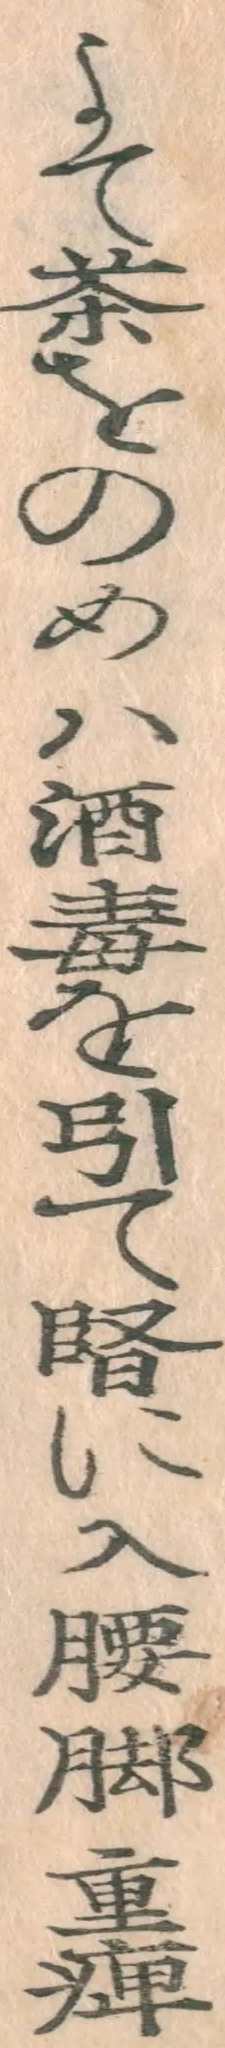よて茶をのめは酒毒引て腎に入腰脚重痺
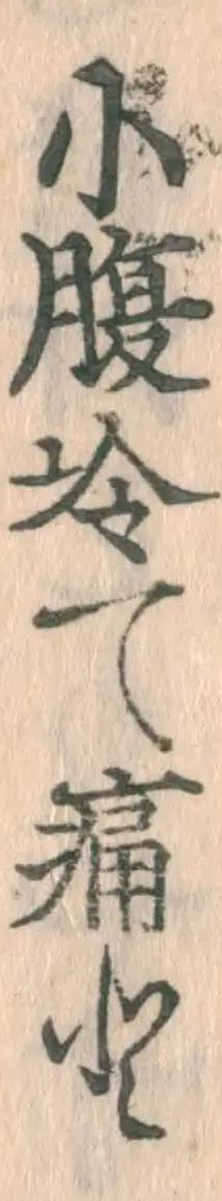小腹冷て痛と
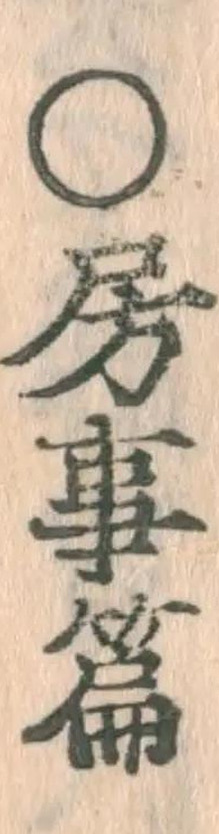〇房事篇
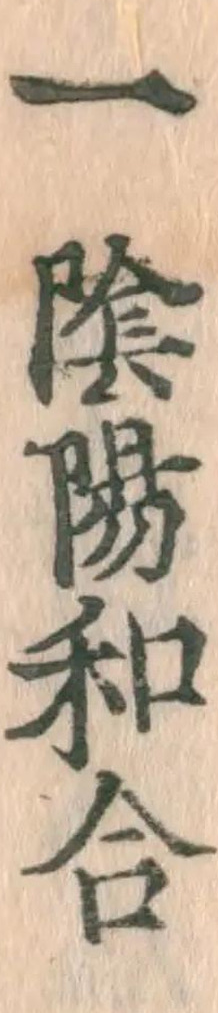一陰陽和合
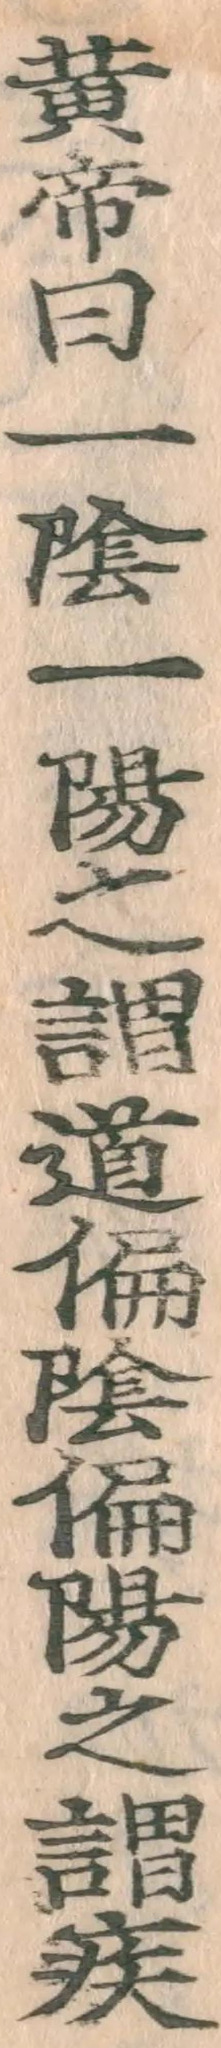黄帝曰一陰一陽之謂道偏陰偏陽之謂疾
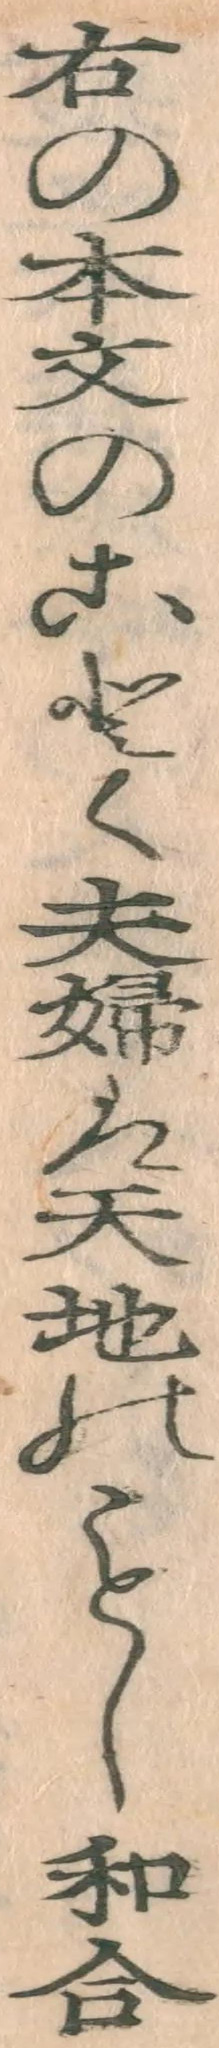右の本文のことく夫婦は天地のことし和合
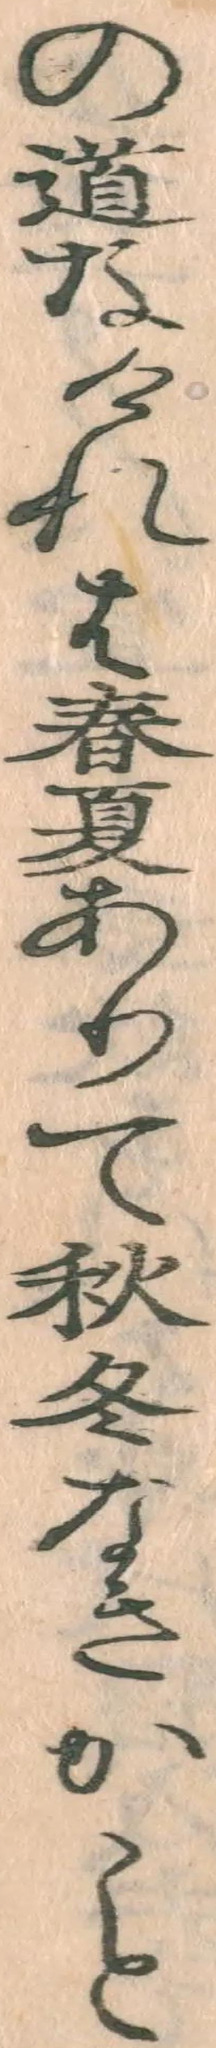の道なけれは春夏ありて秋冬なきかこと
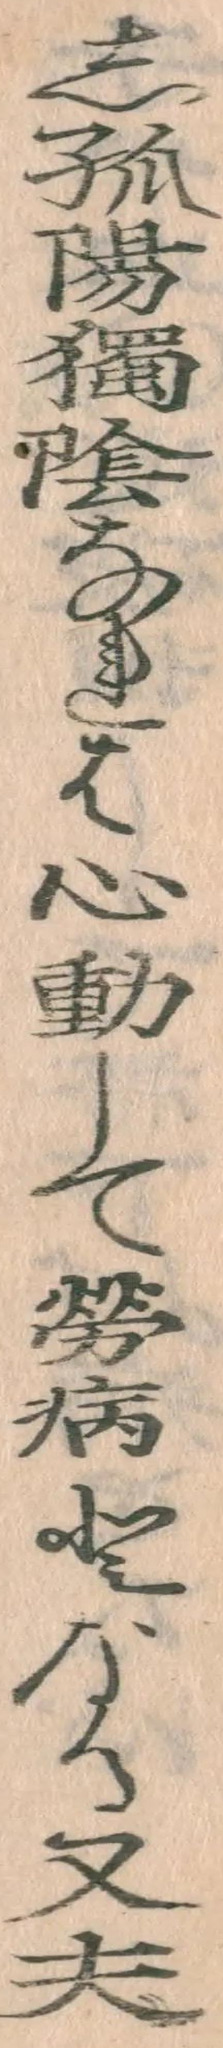し弧陽独陰なれは心動して労病となる又夫
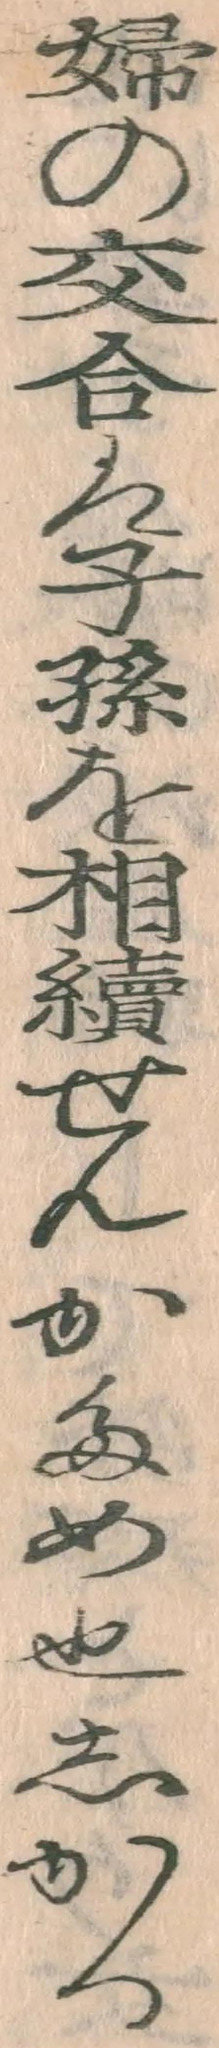婦の交合は子孫を相続せんかため也しかる
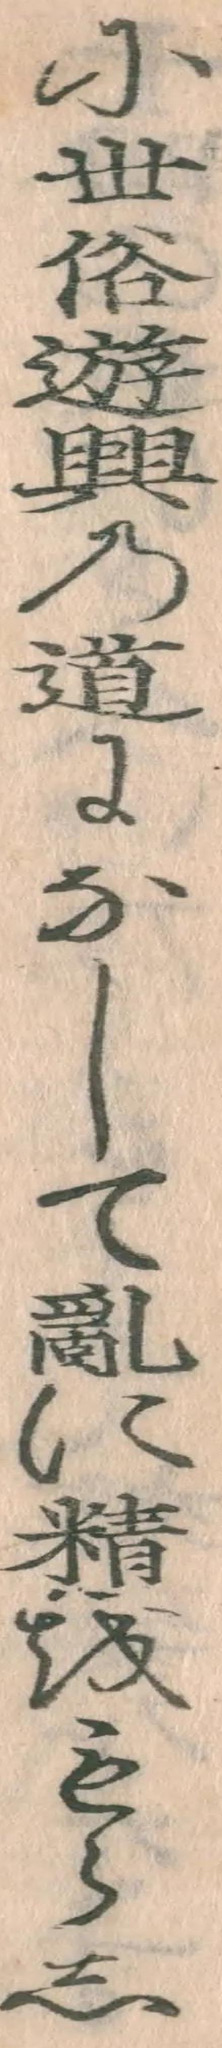に世俗遊興の道になして乱に精をもらし
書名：延壽撮要
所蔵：国立国会図書館 National Diet Library, JAPAN
